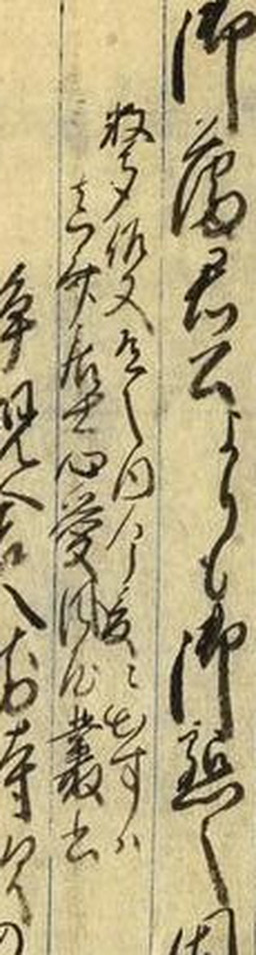数多作文有之内今夏に出すは
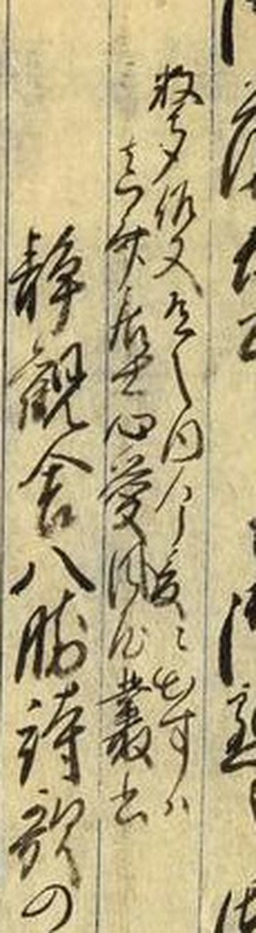真斎居士心愛風屋叢書
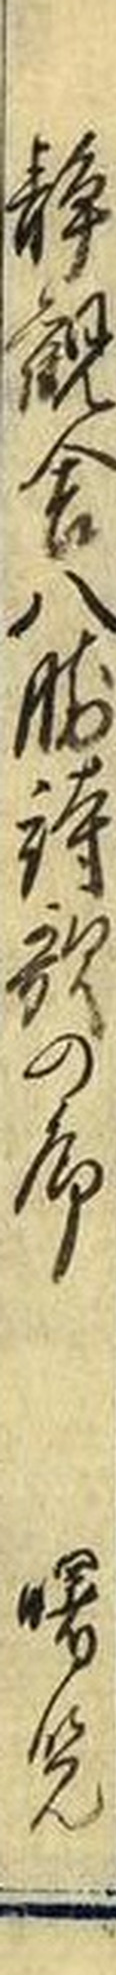静観者舎八勝詩歌の序曙覧
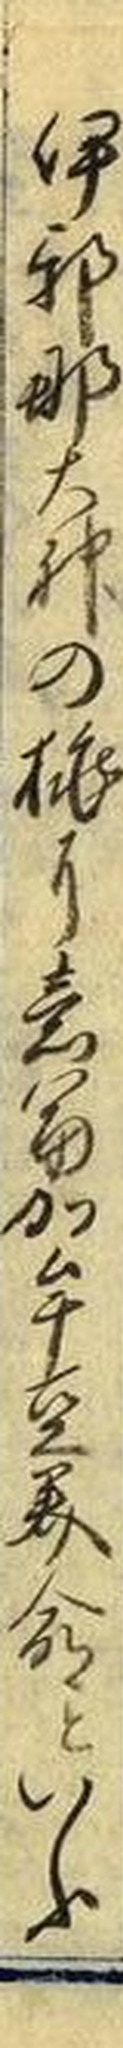伊邪那大神の桃に意冨加牟豆美命といふ
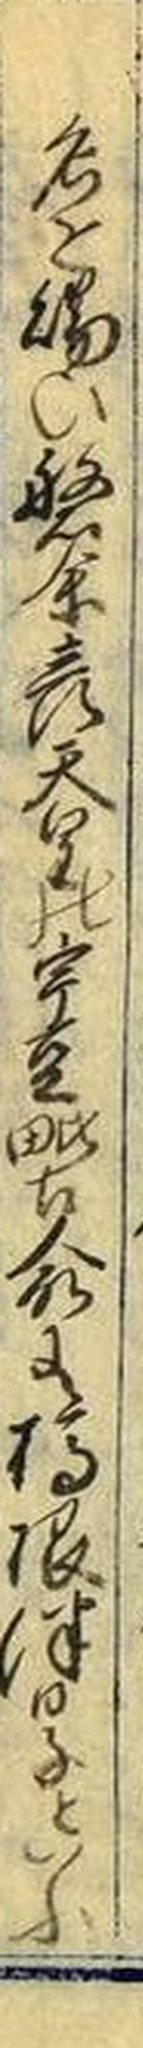名を賜ひ磐余彦天皇の宇豆毘古命に槁根津日子といふ

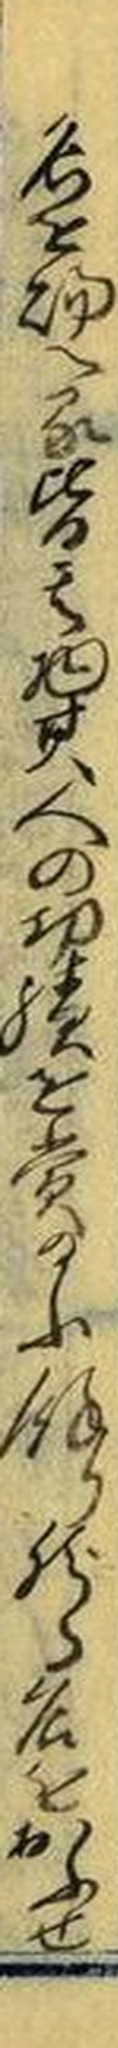名を賜へる皆其物其人の功績を賞給ふ餘り然る名をおふせ
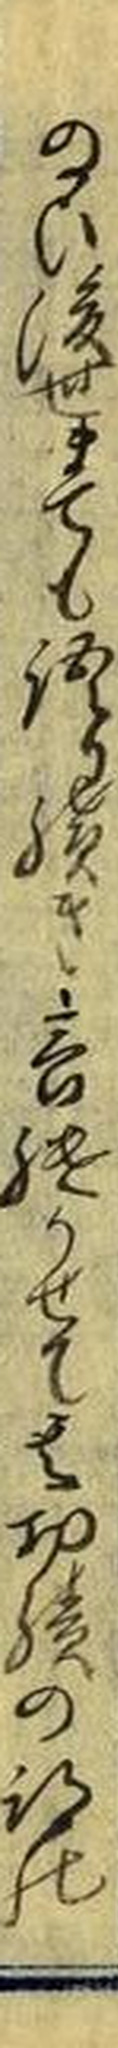給ひ後世まても語り続き言継かせて其功績の跡の
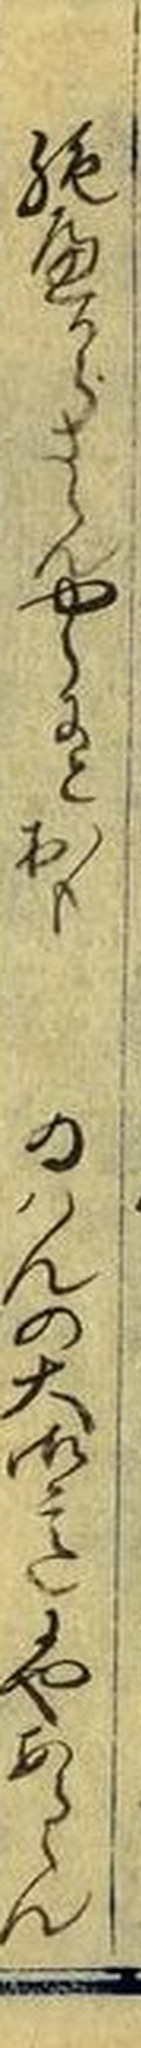絶へらさらんやうにとおも給はんの大御意にやあらん
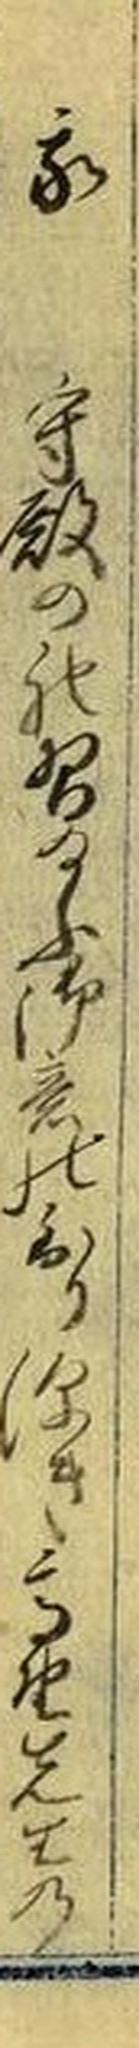我守殿の被習給ふ御意の至り深き高野先生の
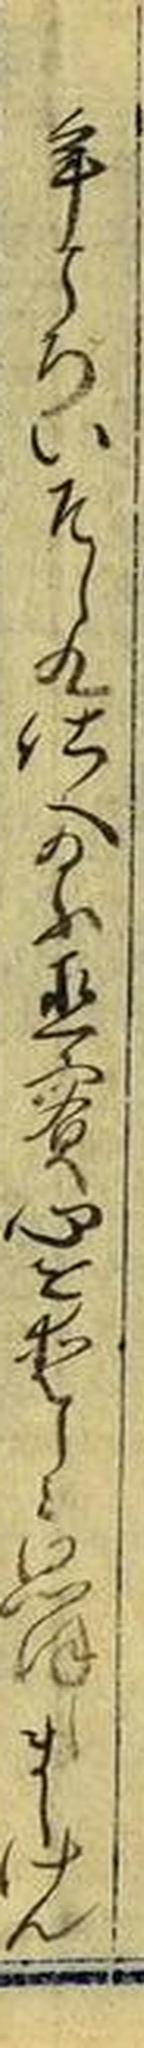年ころいそしく仕へ給ふ直實心を愛しみ思ほしましけん
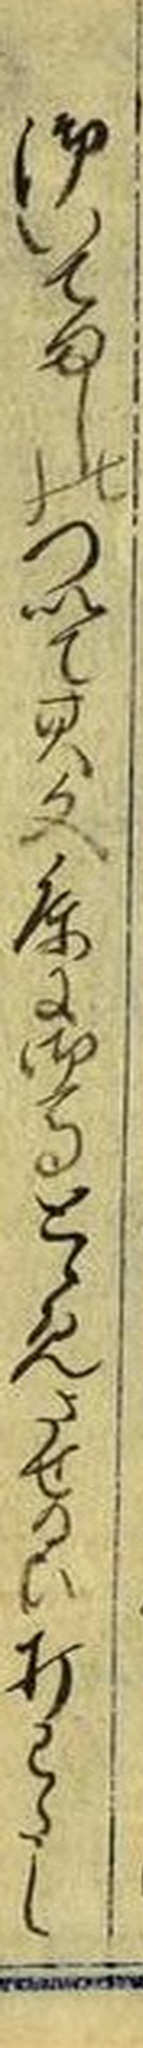御いてましのついて其文庫に御めとゝめさせ給ひ打わたし
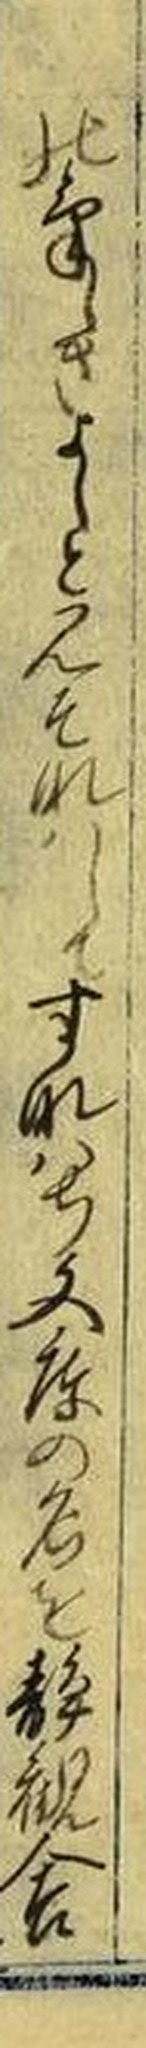此筆きよしと見そなはしてすなはち文庫の名を静観舎と
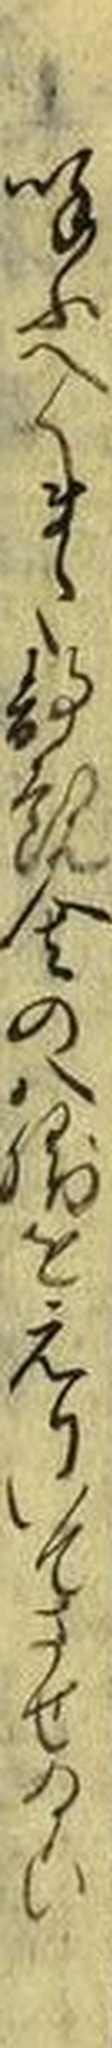呼ふへくまた静観舎の八勝をえりいてさせ給ひ
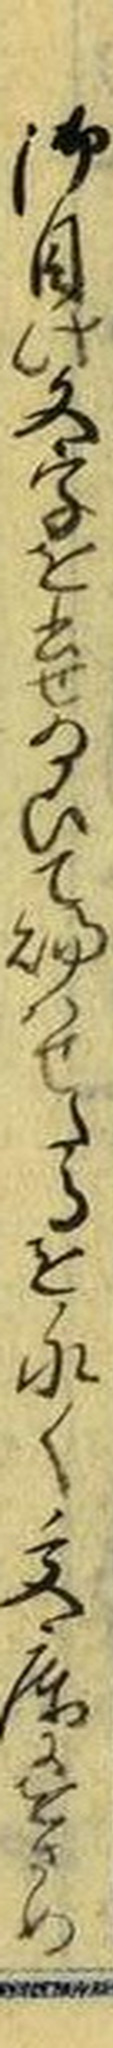御自此文字を書せた給ひて賜はせたるを永く文庫にをさめ
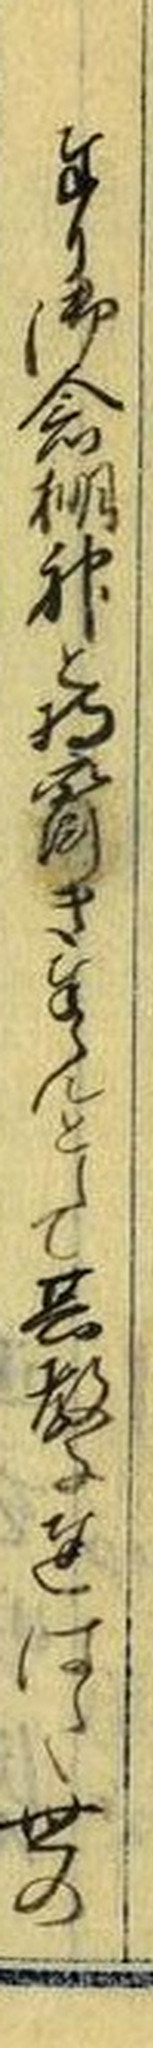奉り御倉棚神と持斎き奉らんとして其教子達はた世の
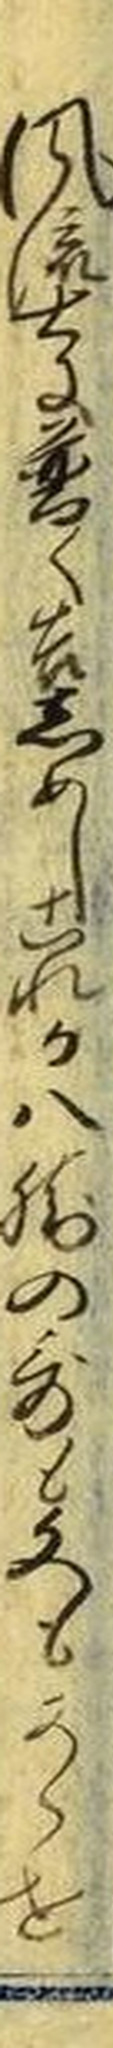風流士に普く告しめしこれか八勝の哥も文もあらせ
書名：温古集 三巻
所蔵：福井県文書館 Fukui Prefectural Archives
